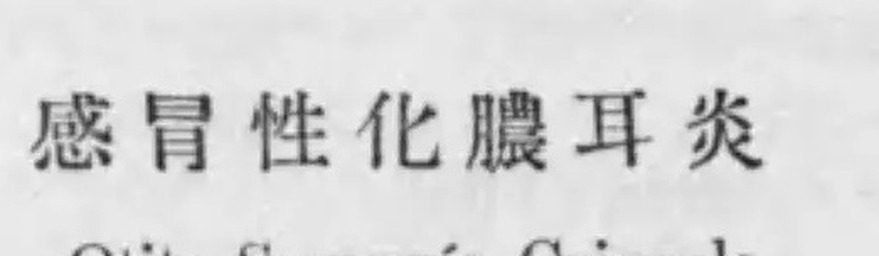感冒性化膿耳炎
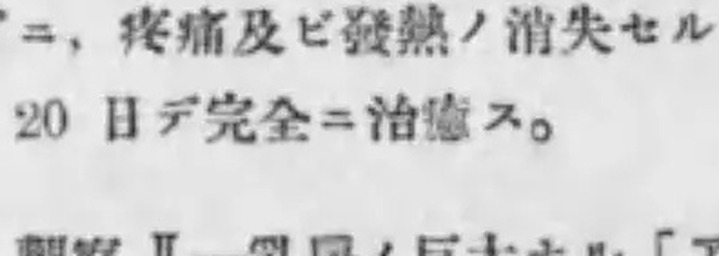日で完全に治癒す。
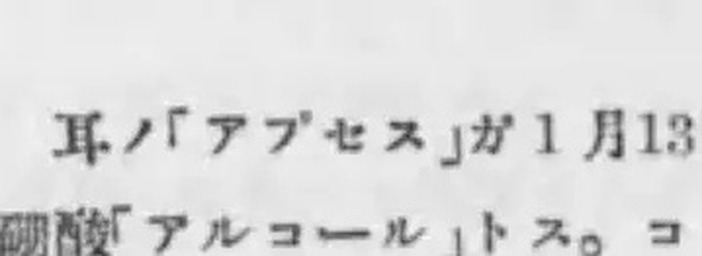中耳の「アプセス」

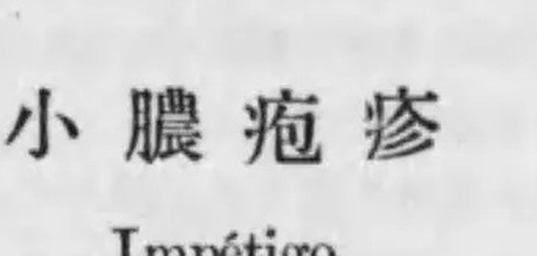小膿疱疹
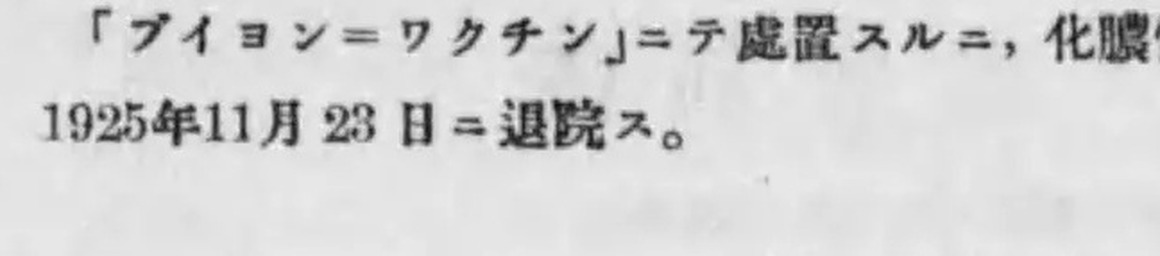年月日に退院す。

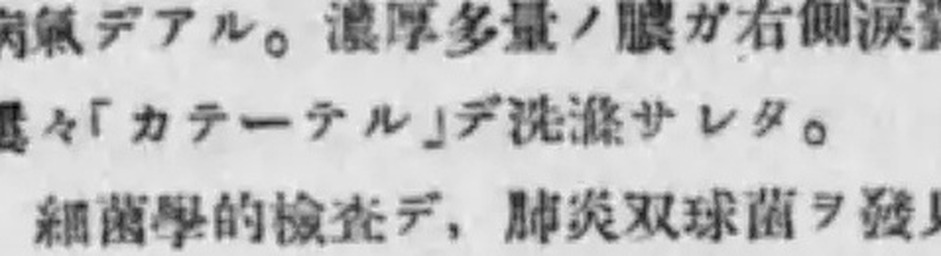屡々「カテーテル」で洗滌された。
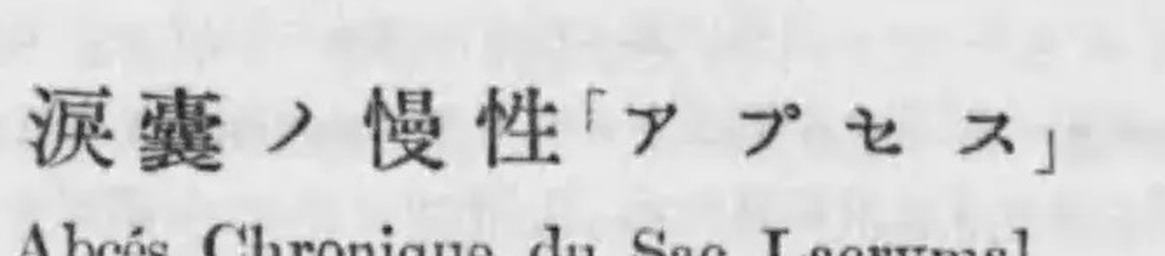涙嚢の慢性「アプセス」

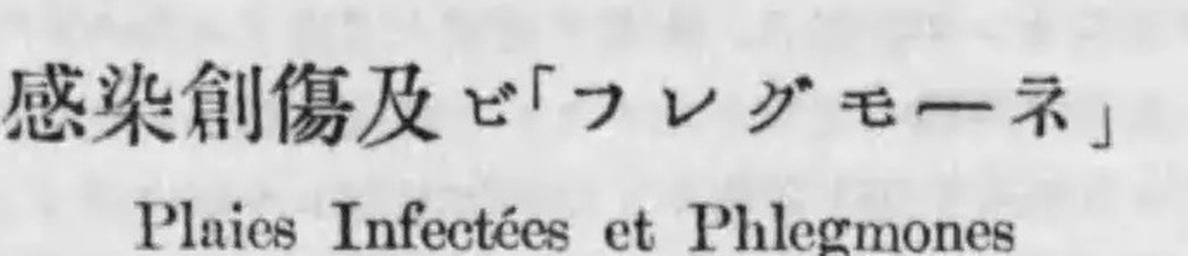感染創傷及び「フレグモーネ」

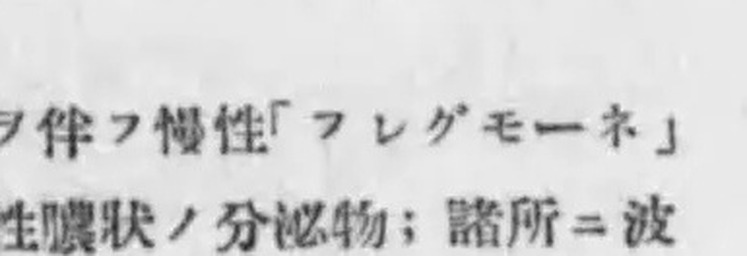伴へる慢性「フレグモーネ」
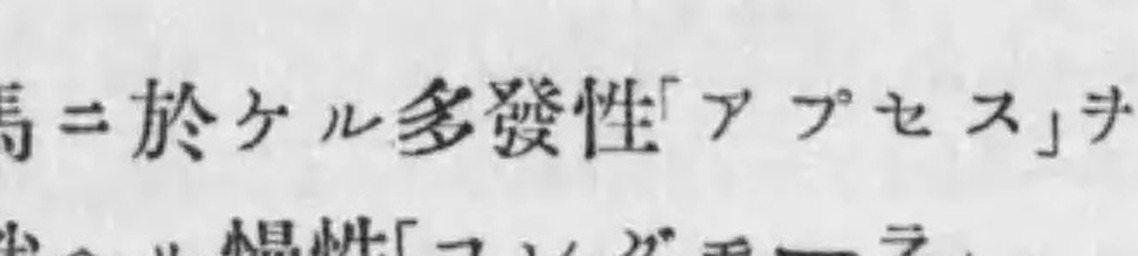馬に於ける多発性「アプセス」を
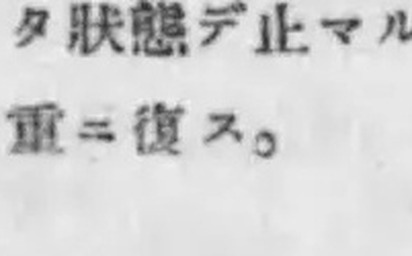重に復す。
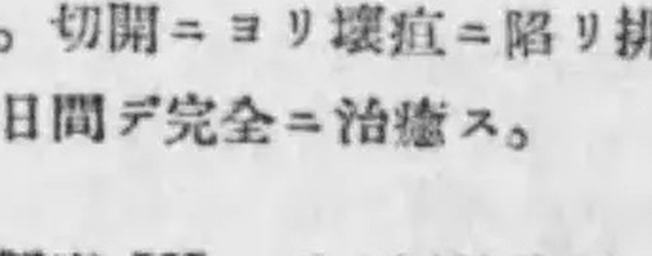日間で完全に治癒す。

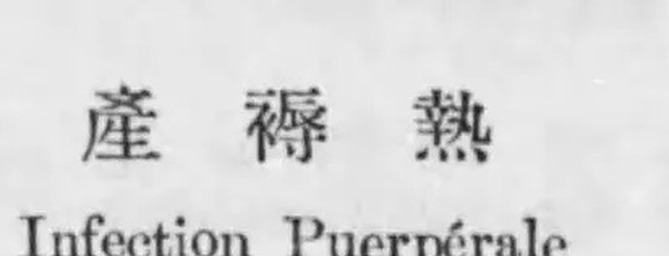産褥熱
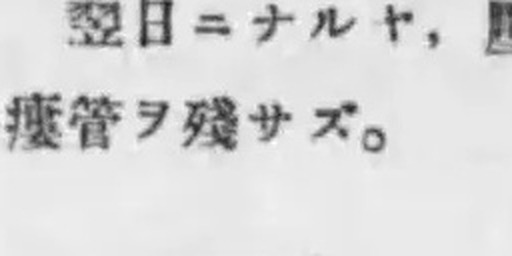瘻管を残さず。

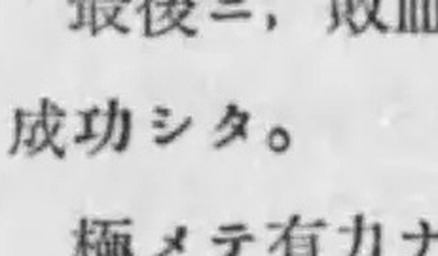成功した。

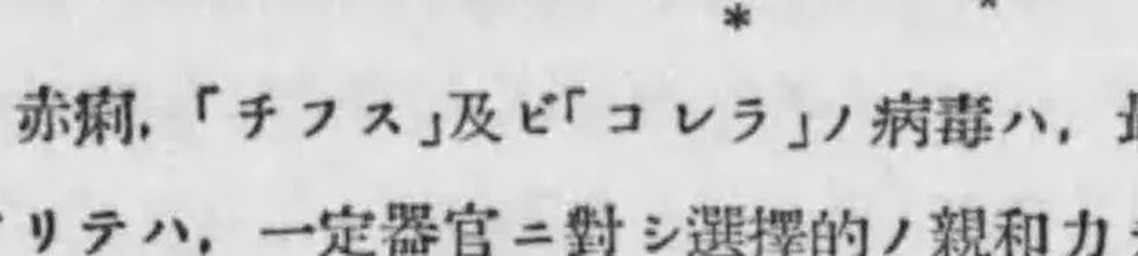赤痢、「チフス」及び「コレラ」に於ける
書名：伝染病ニ於ケル免疫ニ関スル研究
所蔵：国立国会図書館 National Diet Library, JAPAN
